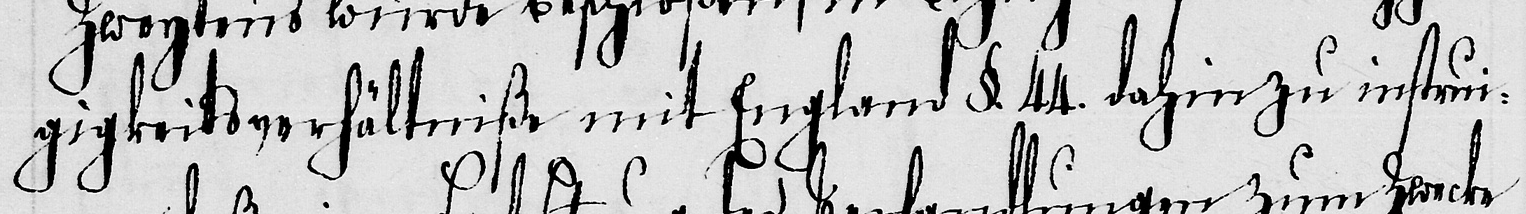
gigkeitsverhältniße mit England §. 44. dahin zu instrui¬
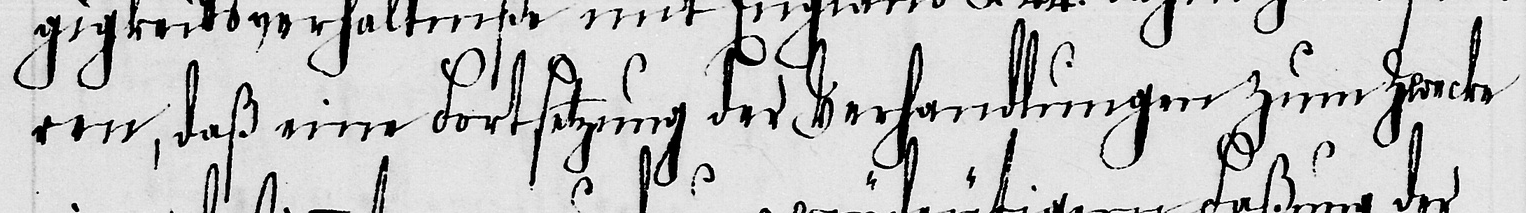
ren, daß eine Fortsetzung der Verhandlungen zum Zwecke
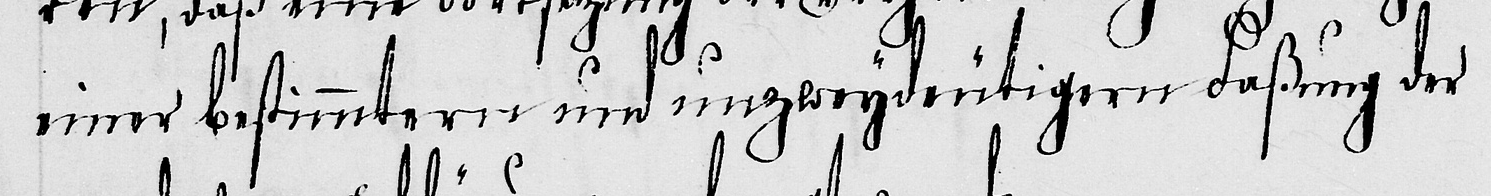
einer bestimmtern und unzweydeutigern Faßung der
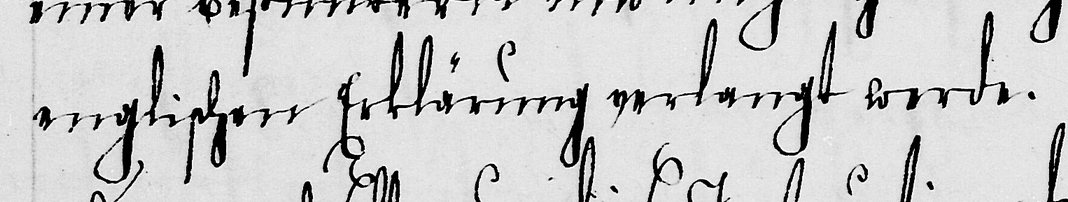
englischen Erklärung verlangt werde.
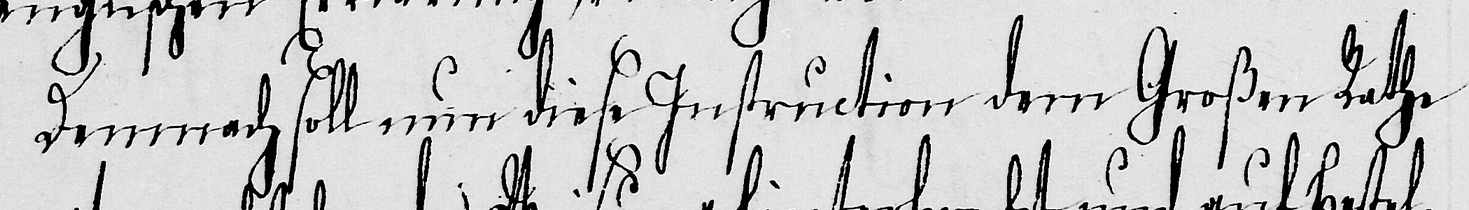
Demnach soll nun diese Instruction dem Großen Rathe
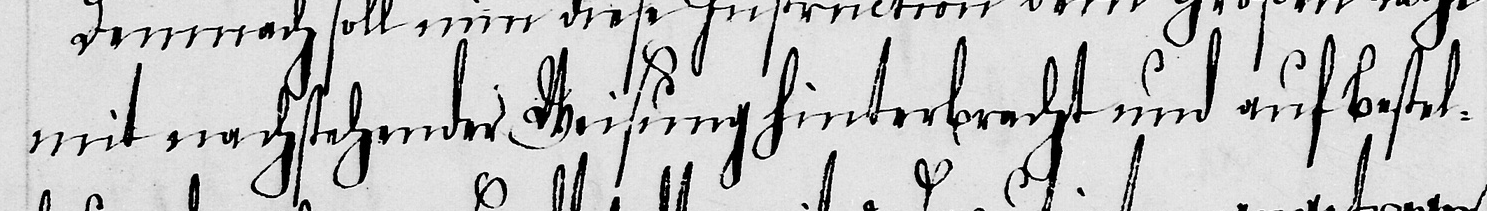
mit nachstehender Weisung hinterbracht und auf Beste¬
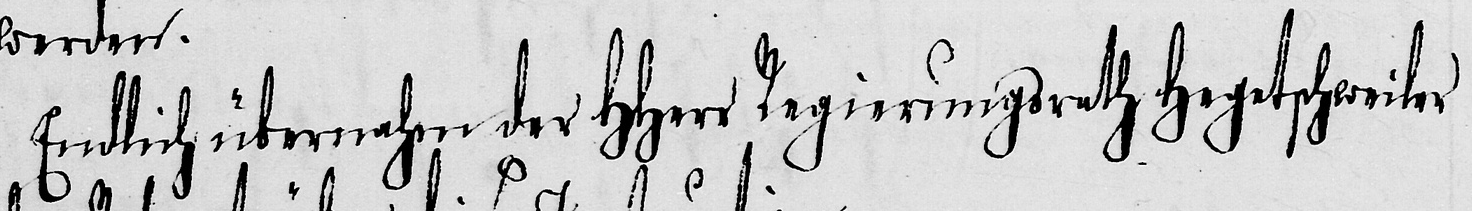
Endlich übernahm der HHerr Regierungsrath Hegetschweiler
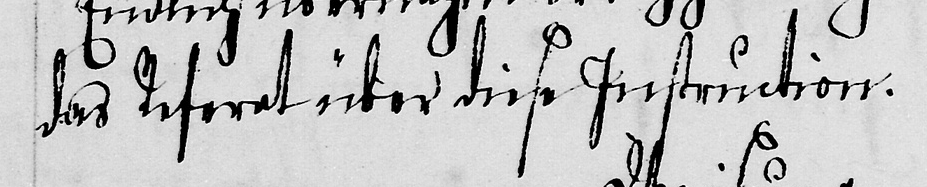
das Referat über diese Instruction.
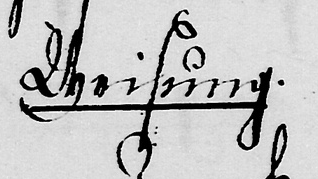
Weisung.
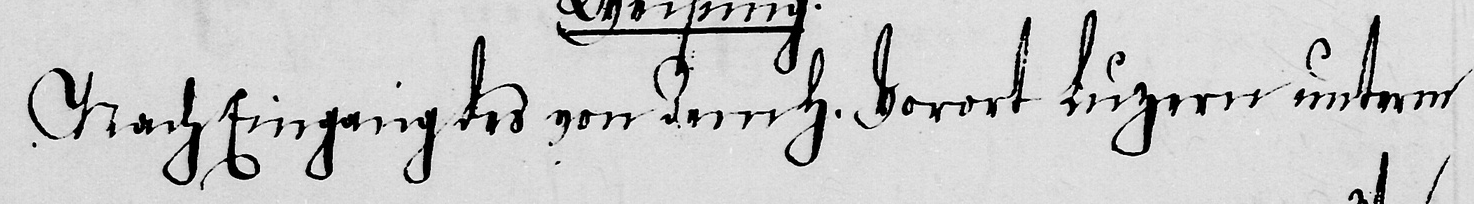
Nach Eingang des von dem H. Vorort Luzern unterm
